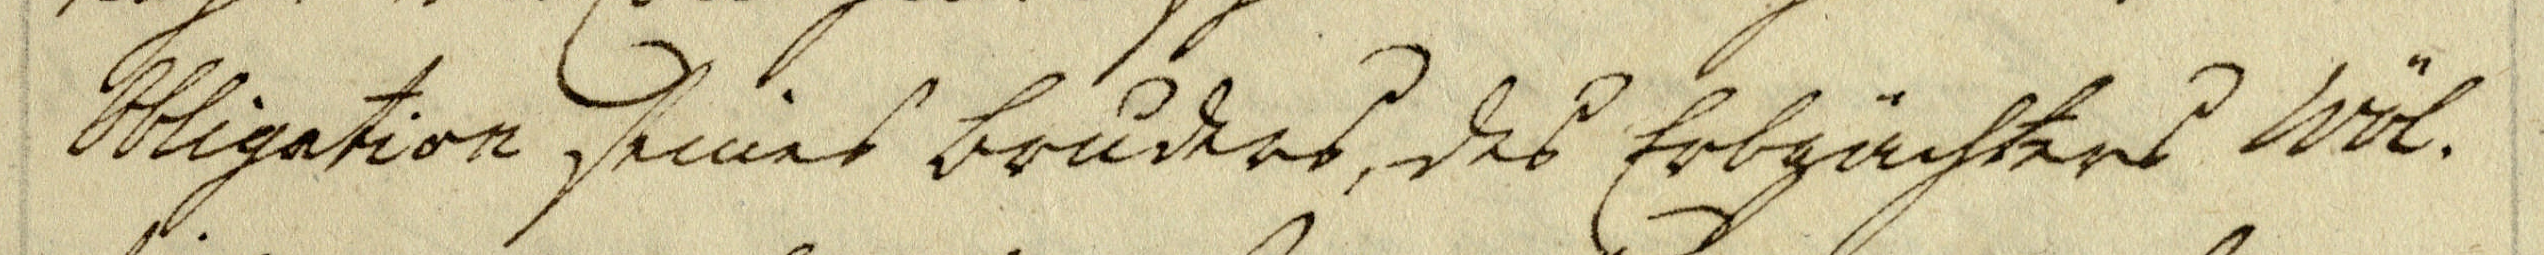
Obligation seines Bruders, des Erbpächtens Wöl¬
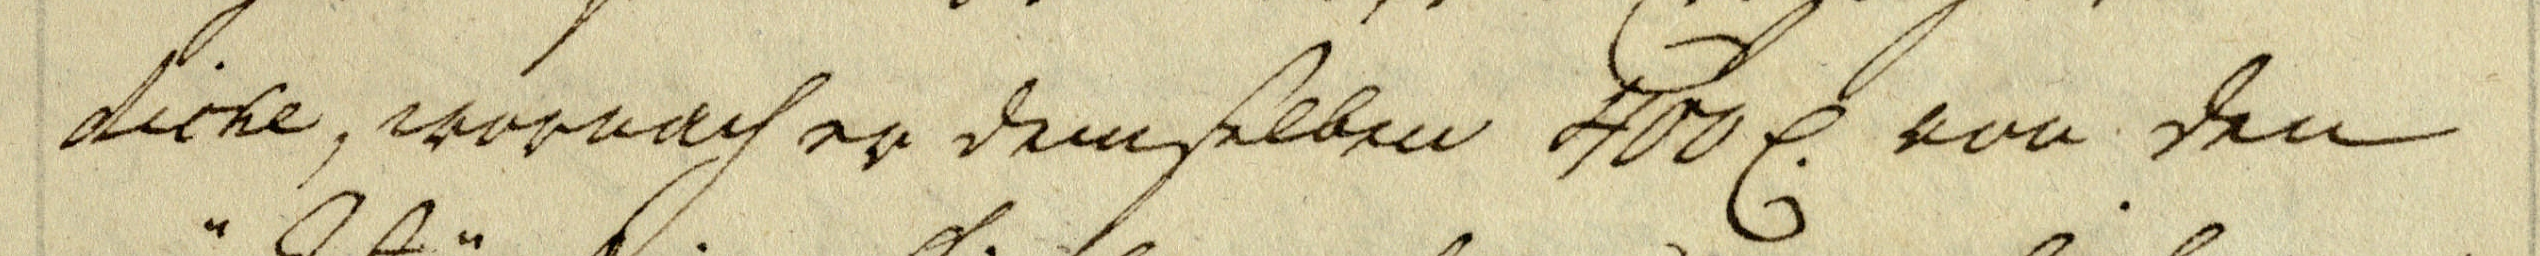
dicke, wornach er demselben 400 l. von den
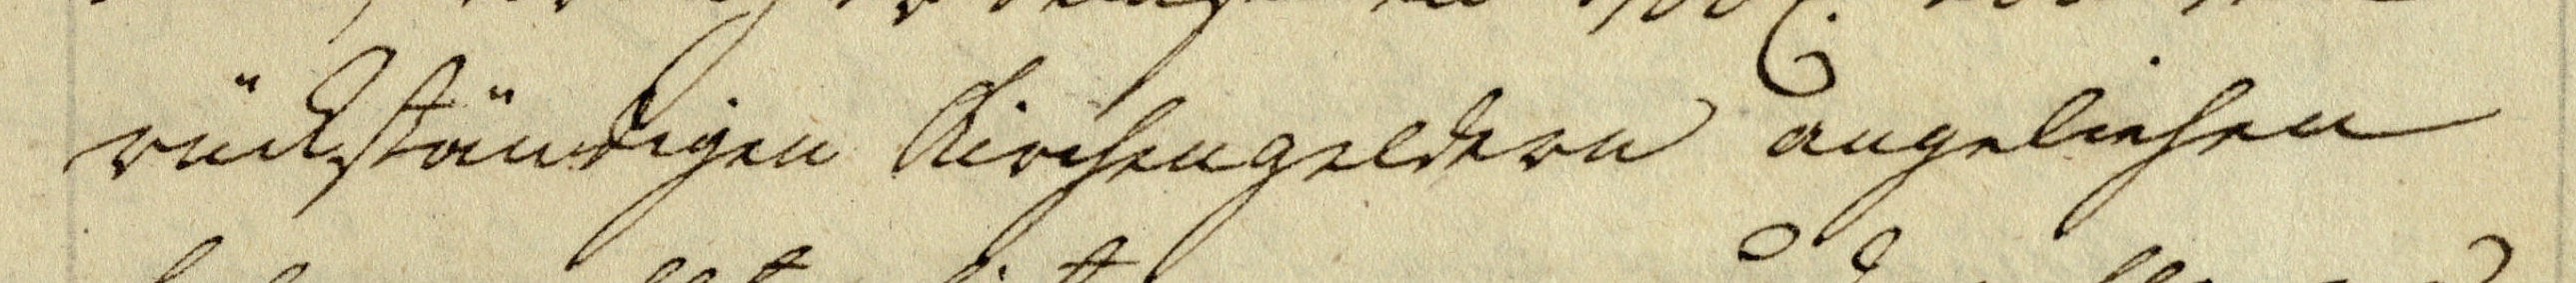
rückständigen Kirchengeldern angeliehen
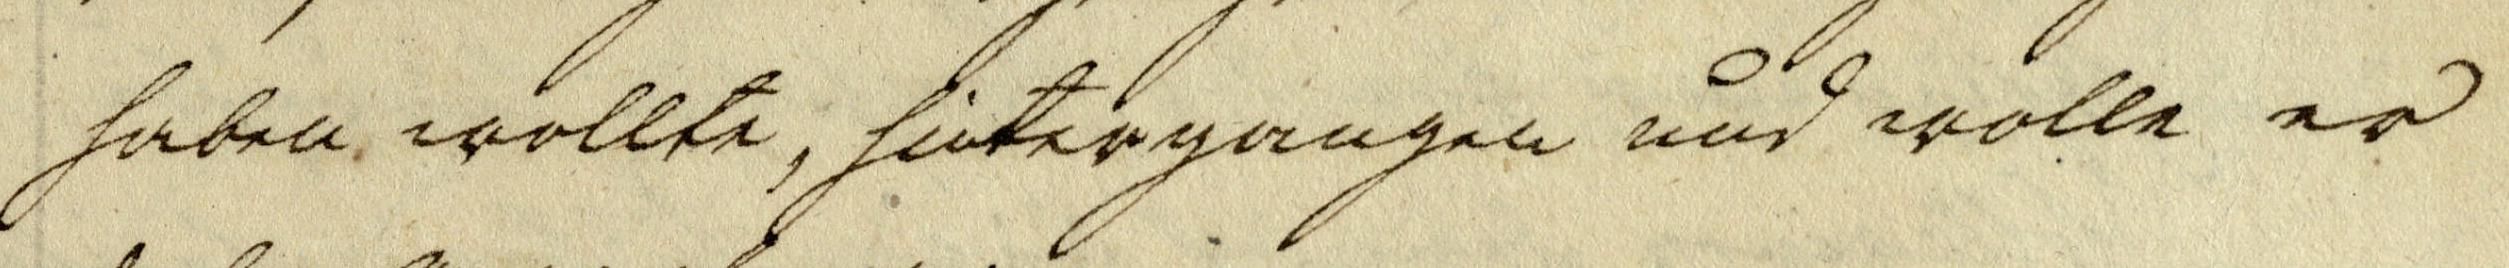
haben wollte, hintergangen und wolle er
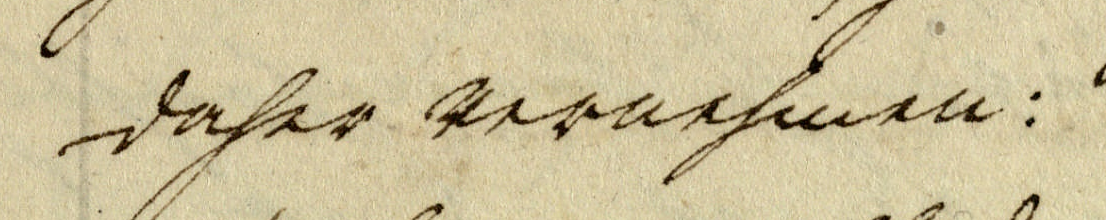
daher vernehmen:
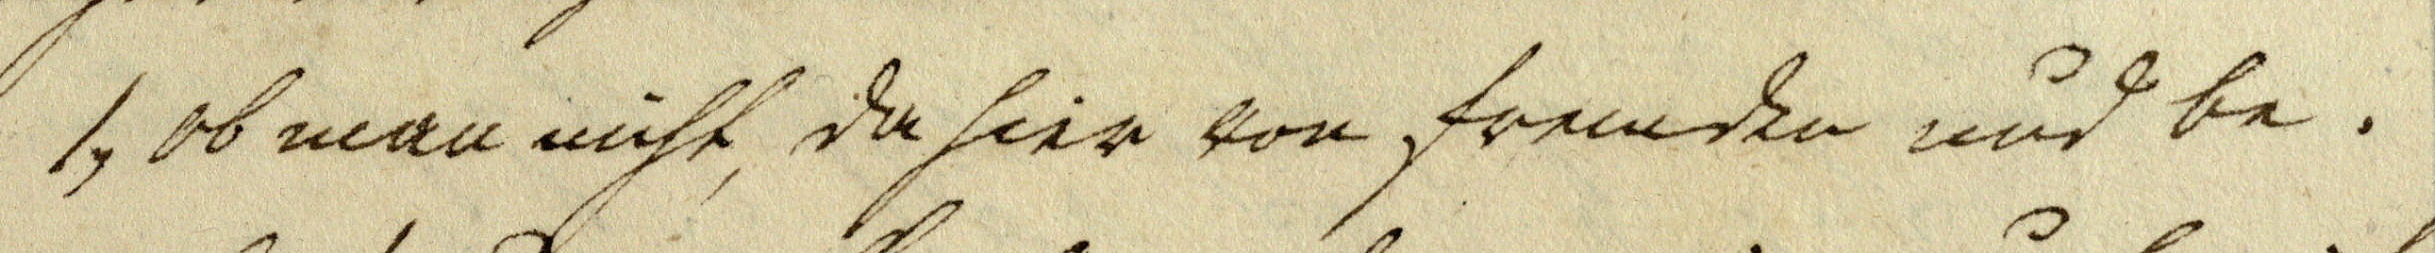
1., ob man nicht, da hier von fremden und be¬
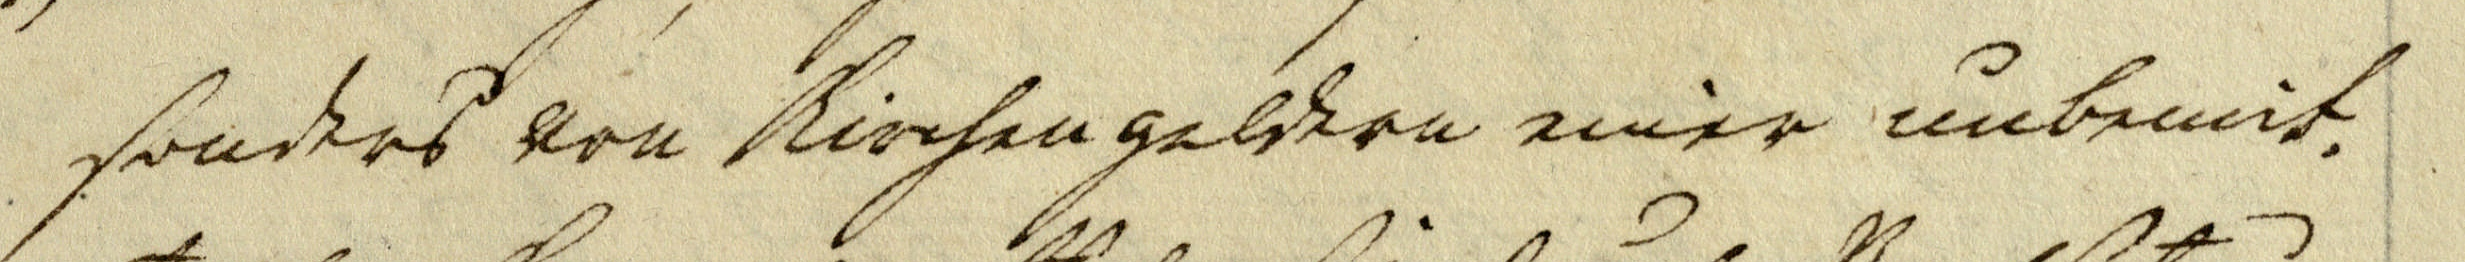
sonders von Kirchengeldern einer unbemit¬
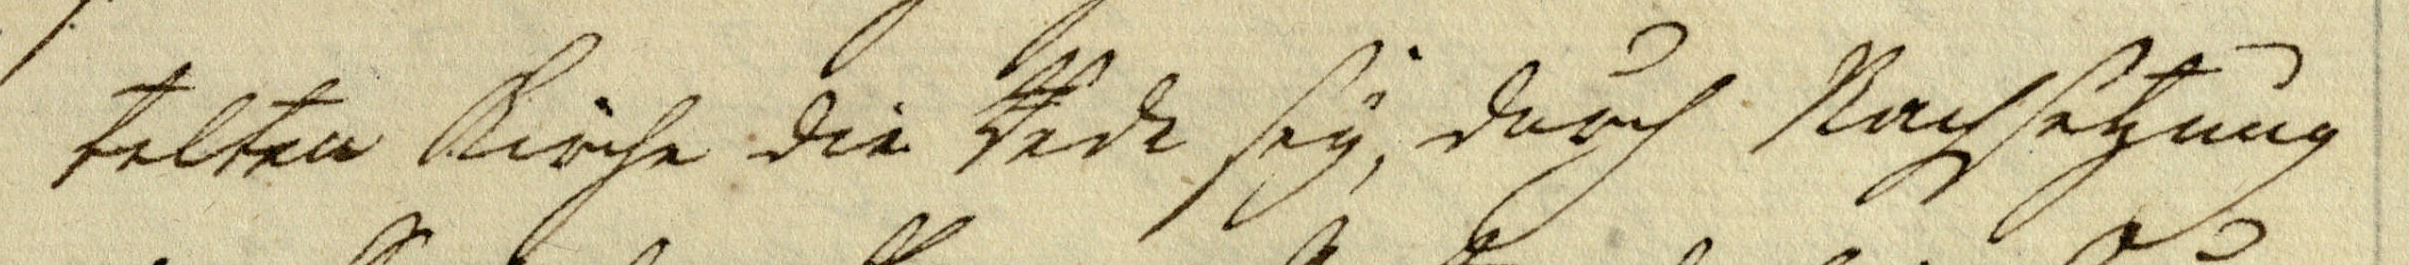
telten Kirche die Rede seÿ, durch Nachsetzung
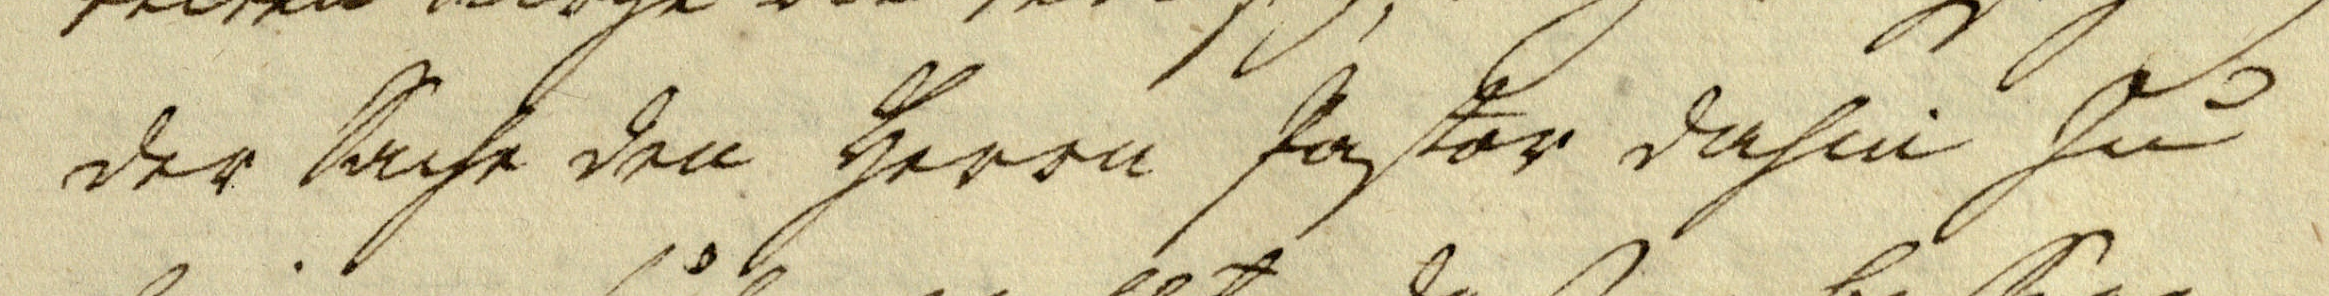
der Sache den Herrn Pastor dahin zu
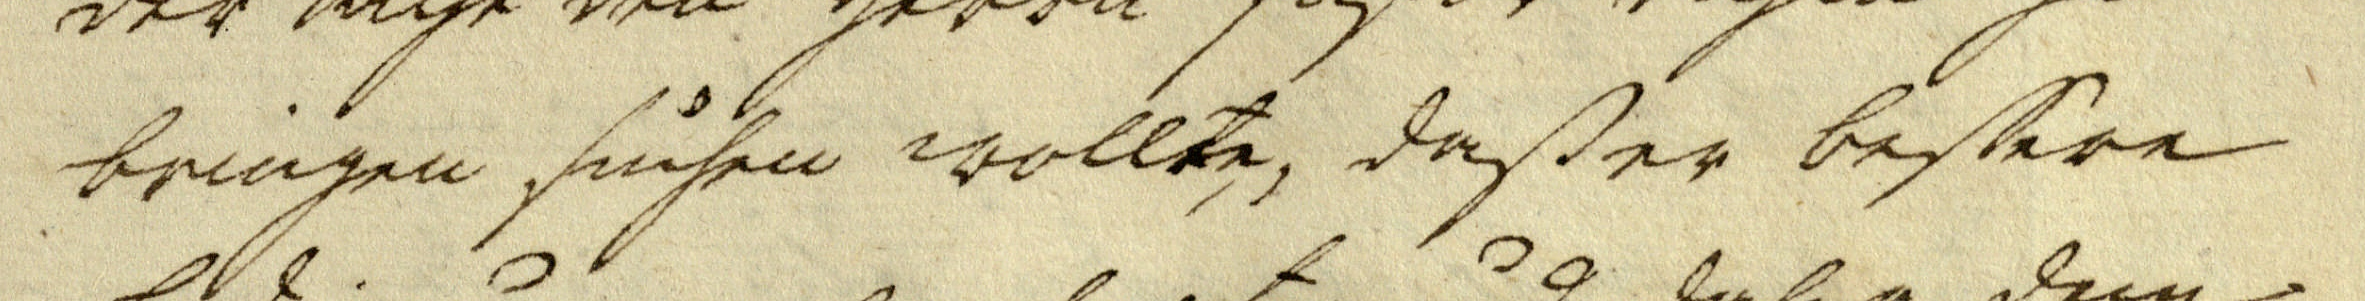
bringen suchen wollte, daß er bessere
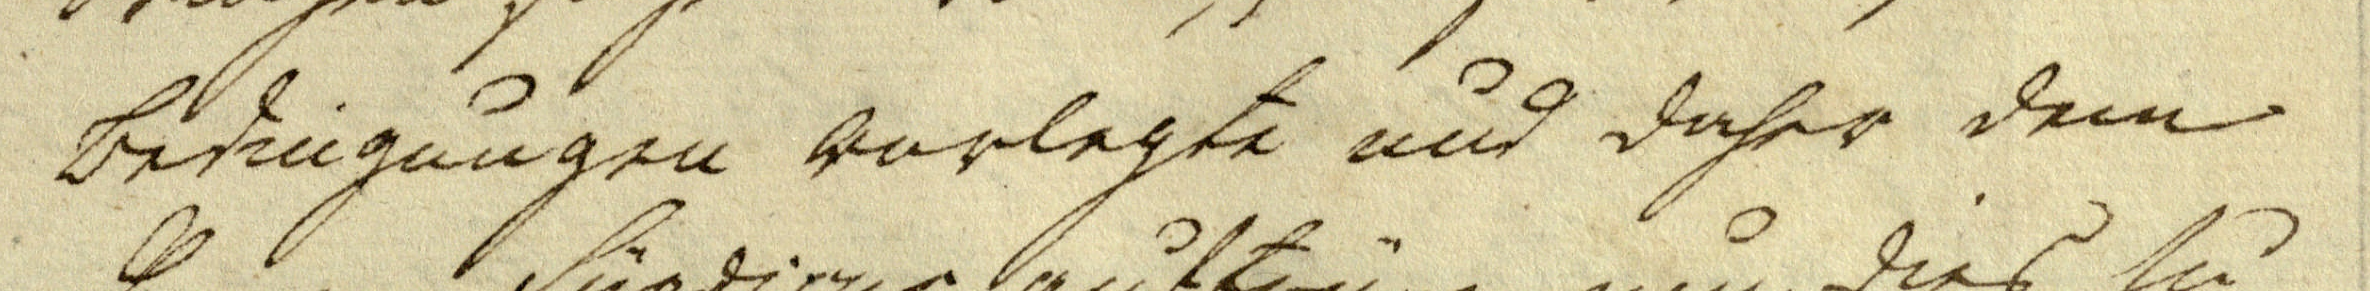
Bedingungen vorlegte und daher dem
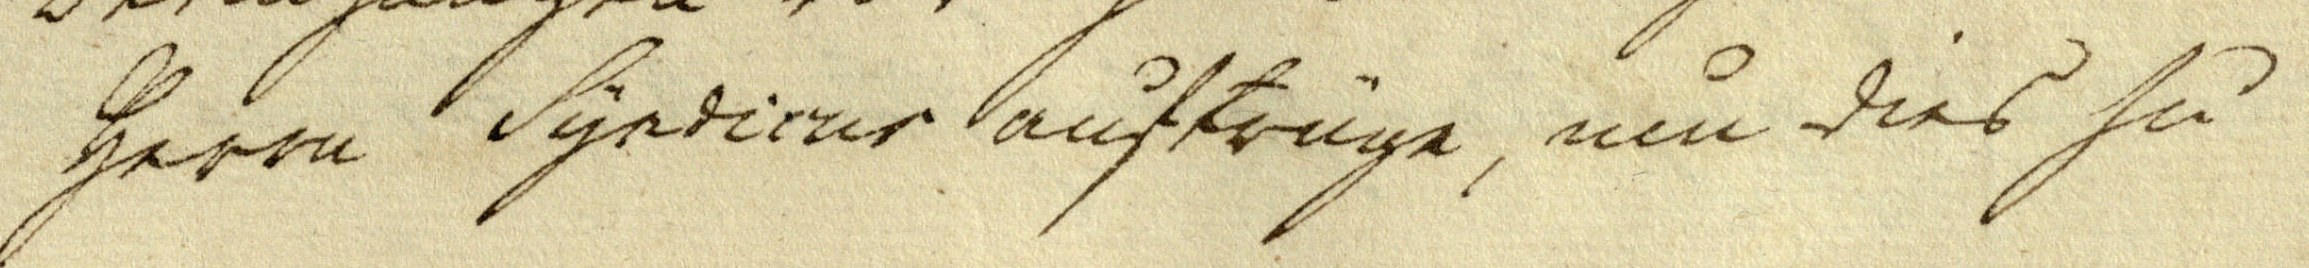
Herrn Sÿndicus auftrüge, um dies zu
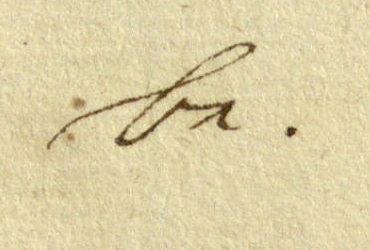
be.
